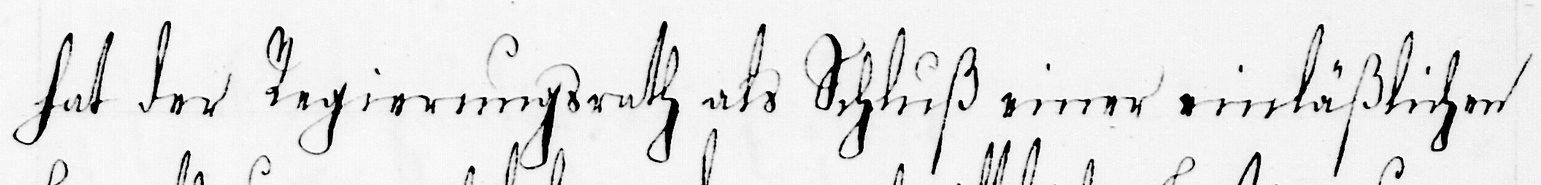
hat der Regierungsrath als Schluß einer einläßlichen
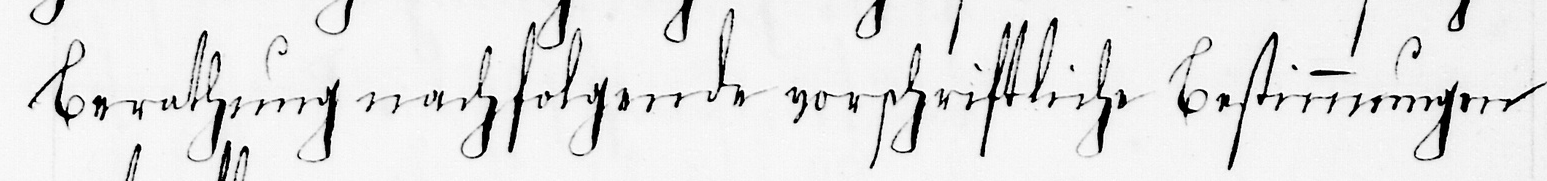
Berathung nachfolgende vorschriftliche Bestimmungen
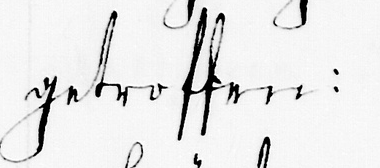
getroffen:
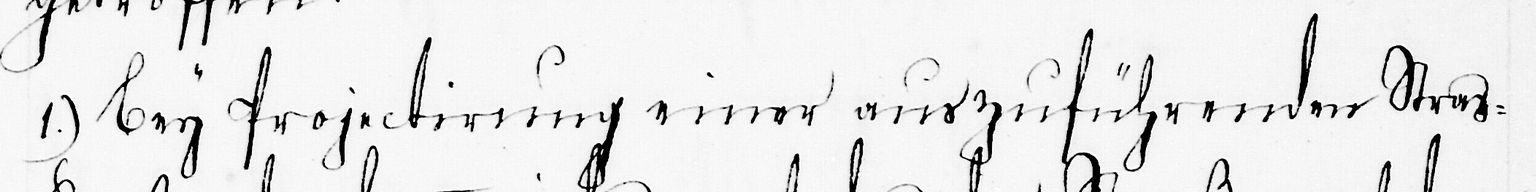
1.) Bey Projectirung einer auszuführenden Straß¬
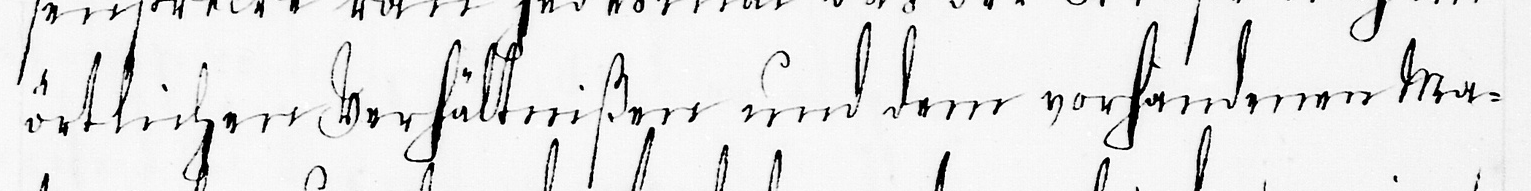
örtlichen Verhältnißen und dem vorhandenen Ma¬
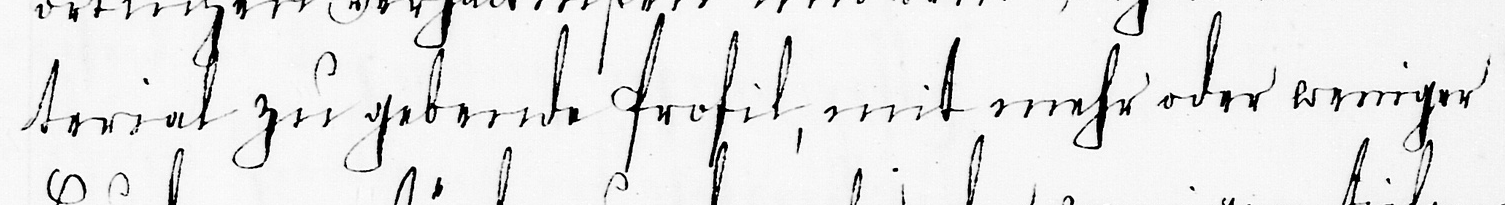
terial zu gebende Profil, mit mehr oder weniger
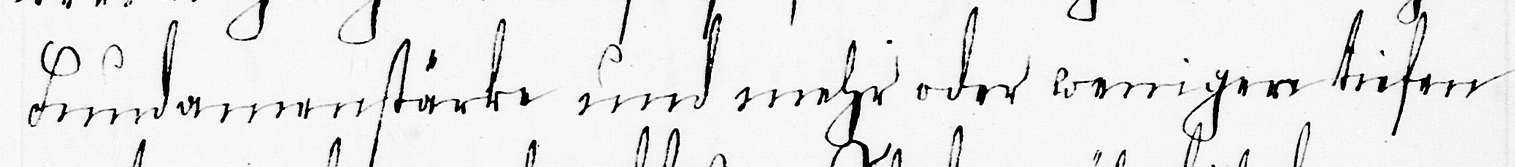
Fundamentstärke und mehr oder weniger tiefen
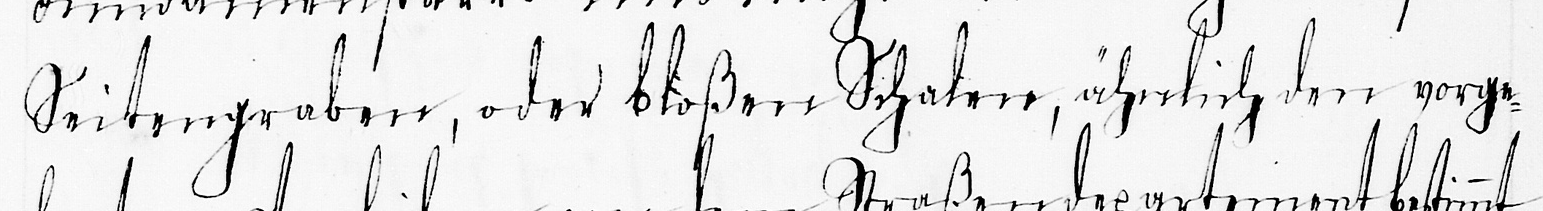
Seitengraben, oder bloßen Schalen, ähnlich den vorge¬
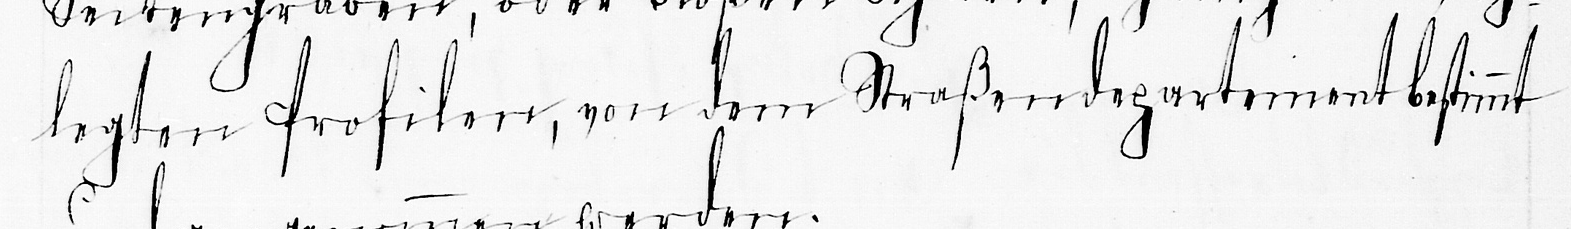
legten Profilen, von dem Straßendepartement bestimmt
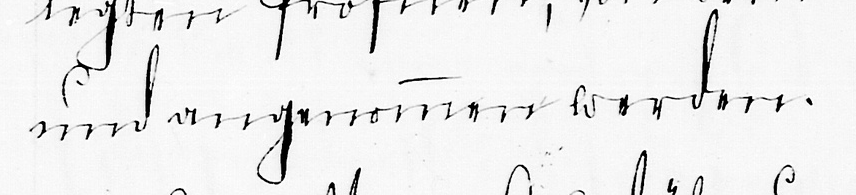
und angenommen werden.
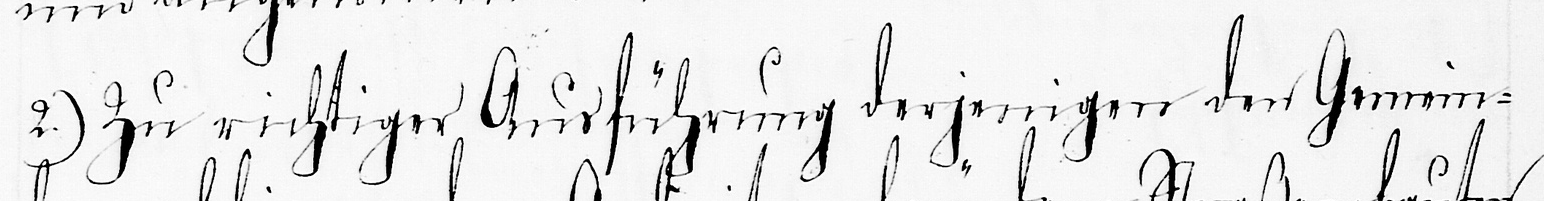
2.) Zu richtiger Ausführung derjenigen der Gemein¬
